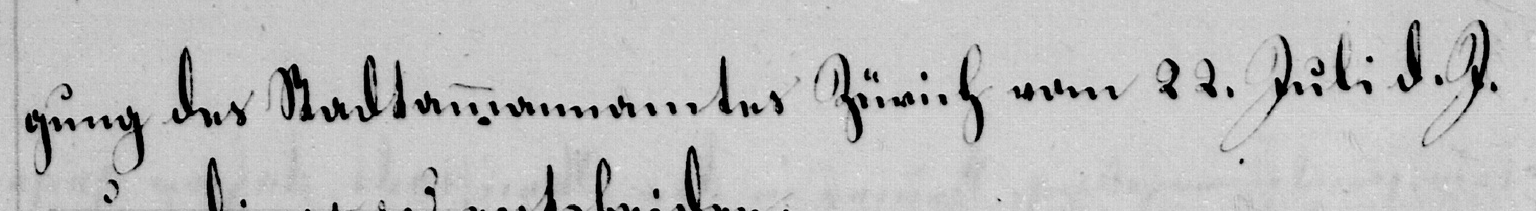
gung des Stadtammannamtes Zürich vom 22. Juli d. J.
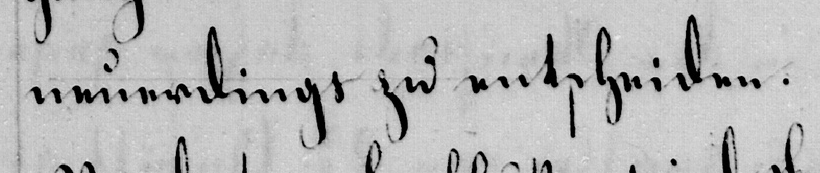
neuerdings zu entscheiden.
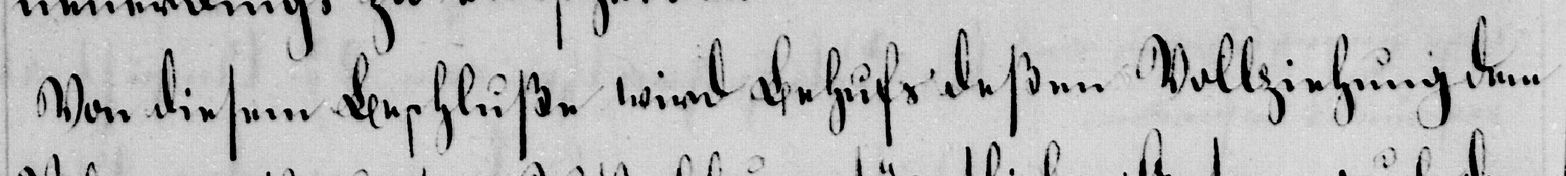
Von diesem Beschluße wird Behufs deßen Vollziehung dem
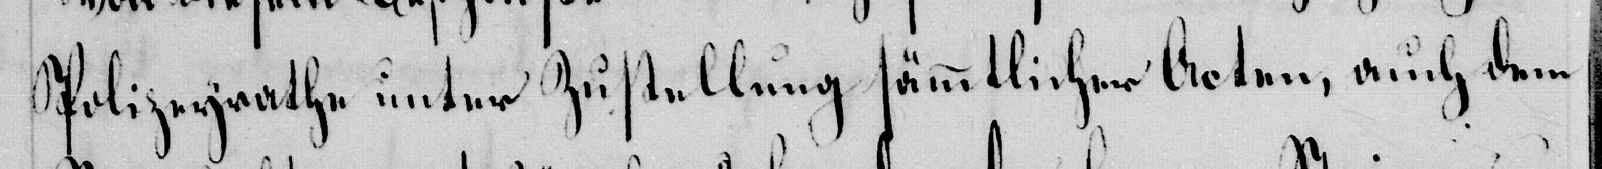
Polizeyrathe unter Zustellung sämmtlicher Acten, auch dem
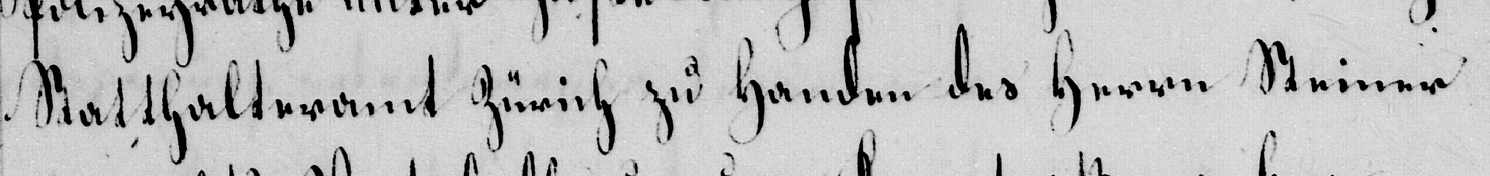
Statthalteramt Zürich zu Handen des Herrn Steiner
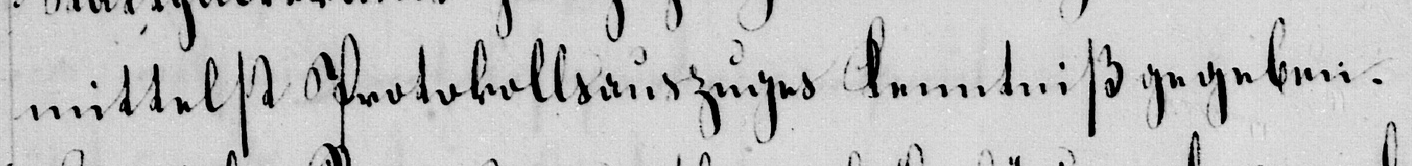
mittelst Protokollsauszuges Kenntniß gegeben.
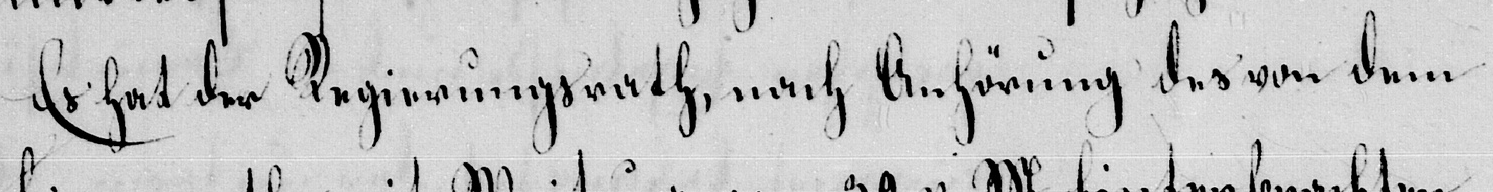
Es hat der Regierungsrath, nach Anhörung des von dem
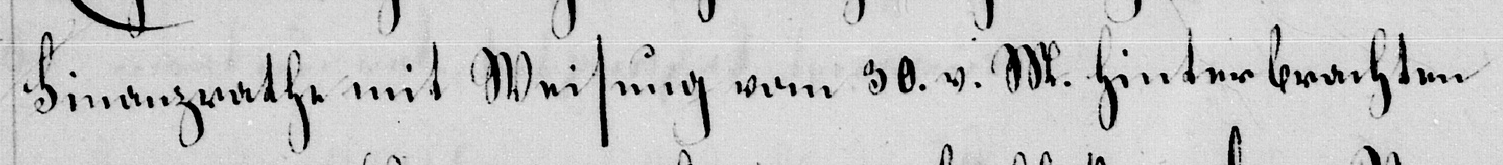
Finanzrathe mit Weisung vom 30. v. M. hinterbrachten
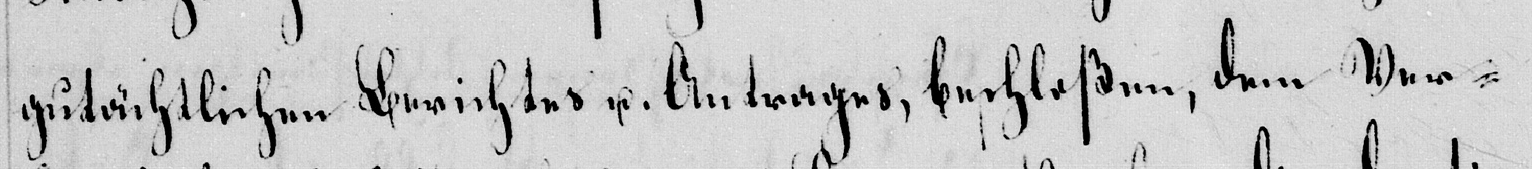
gutächtlichen Berichtes u. Antrages, beschloßen, dem Ver¬
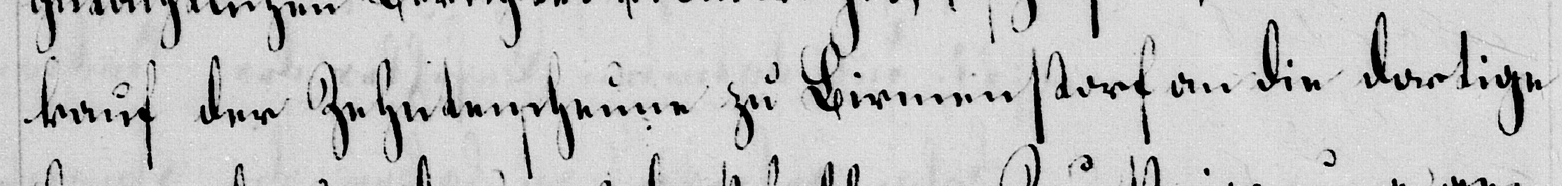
kauf der Zehntenscheune zu Birmenstorf an die dortige
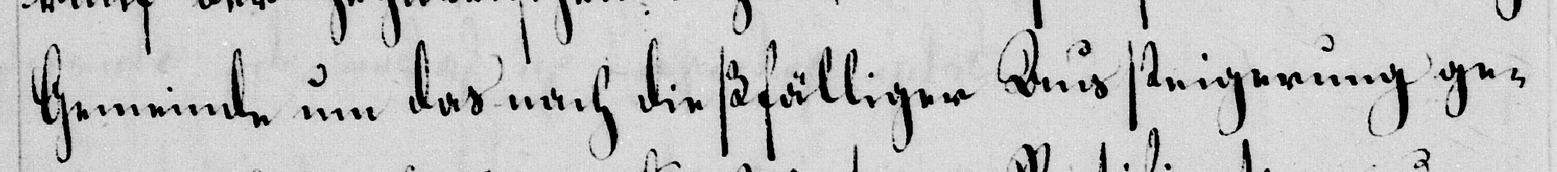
Gemeinde um das nach dießfälliger Aussteigerung ge¬
